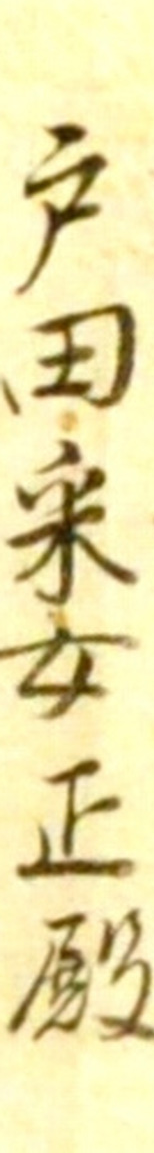戸田采女正殿
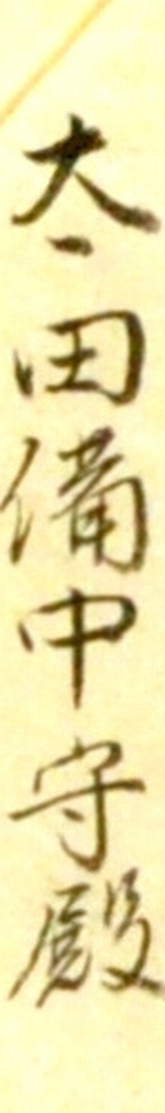太田備中守殿

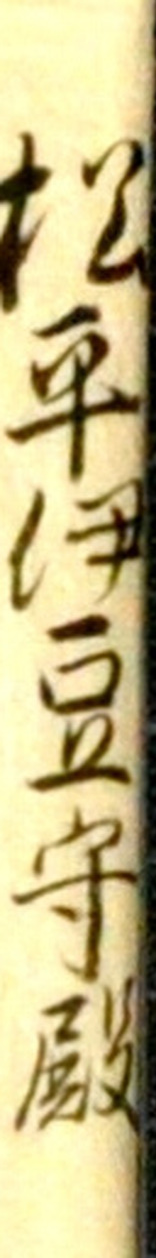松平伊豆守殿
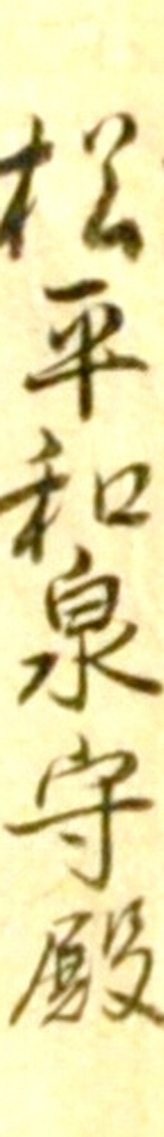松平伊豆守殿
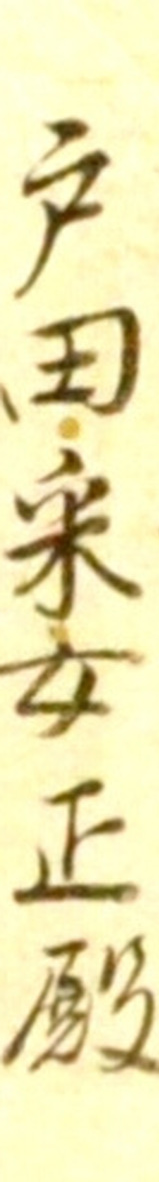戸田采女正殿
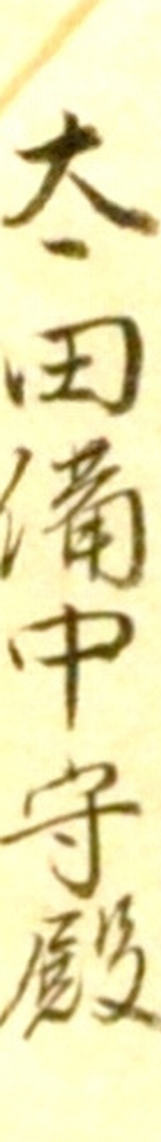太田備中守殿

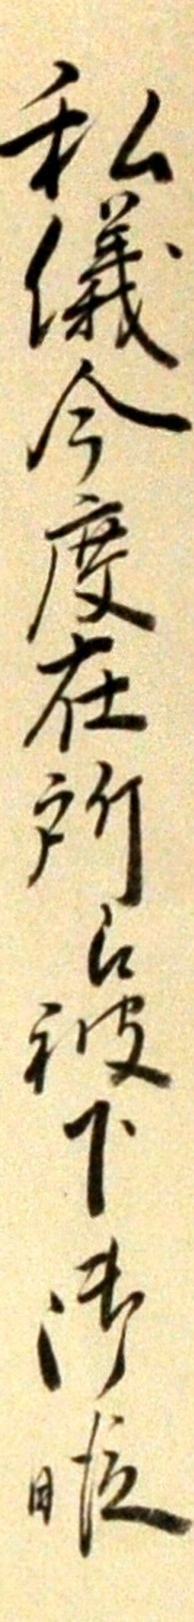私儀今度在所江被下御暇
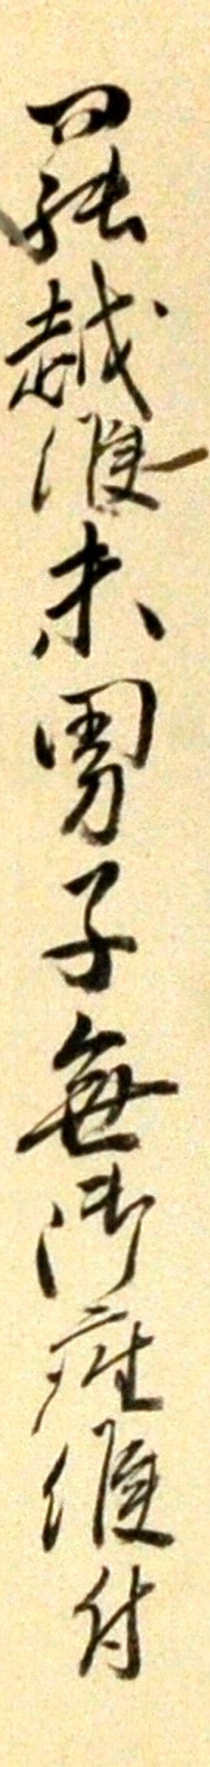罷越候未男子無御座候付
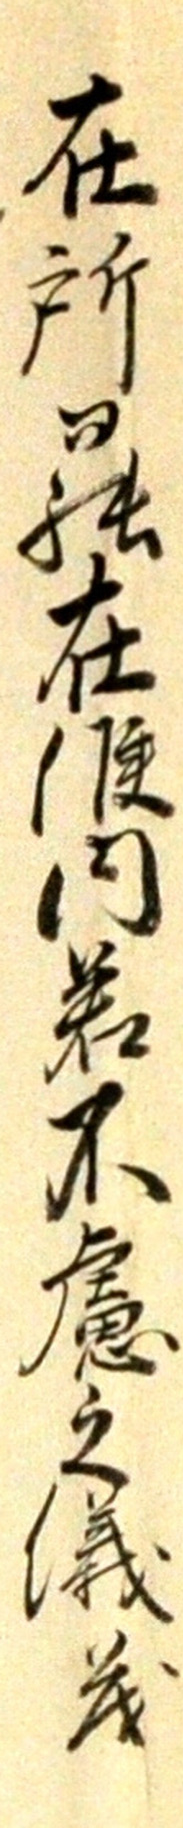在所罷在候内若不慮之儀茂
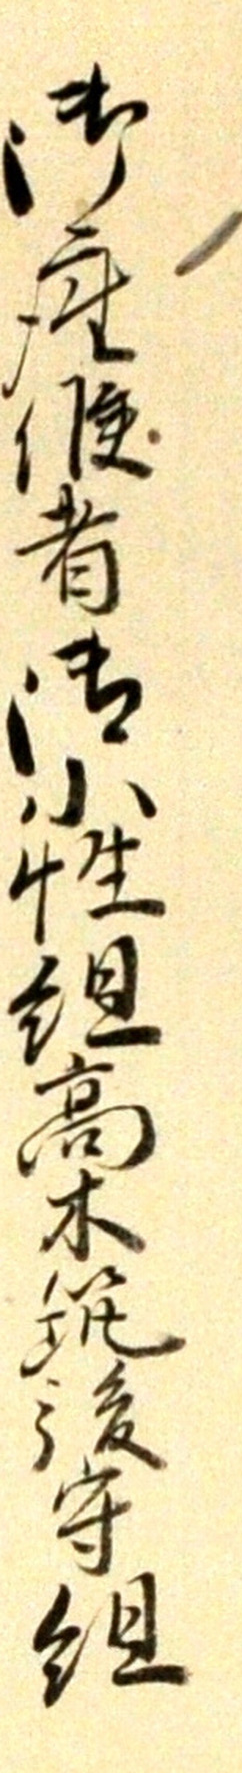御座候者御小姓組高木筑後守組
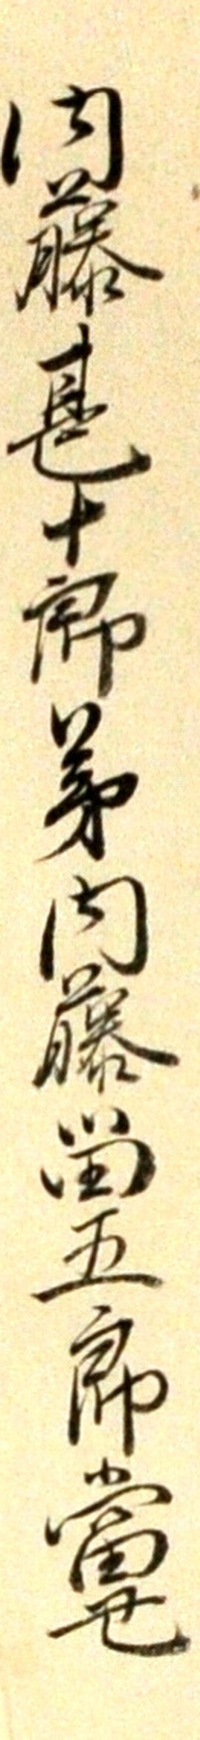内藤甚十郎弟内藤留五郎当丑
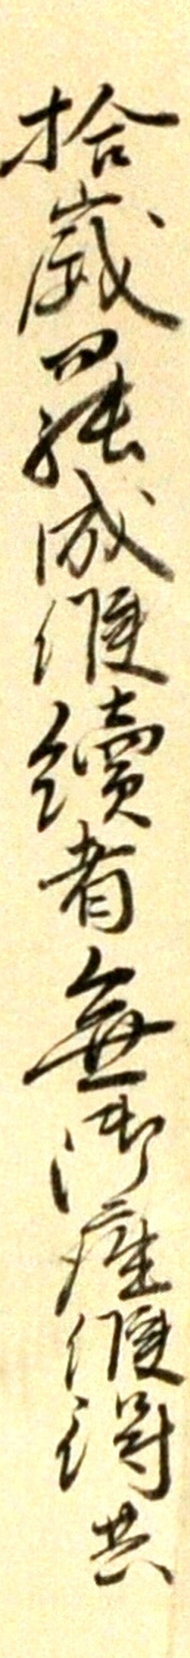拾歳罷成候続者無御座候得共
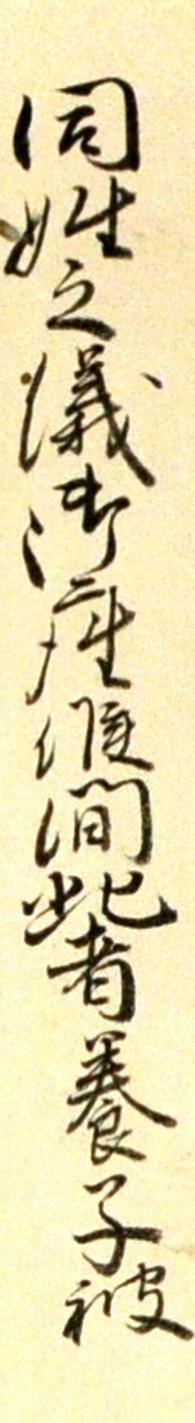同姓之儀御座候間此者養子被
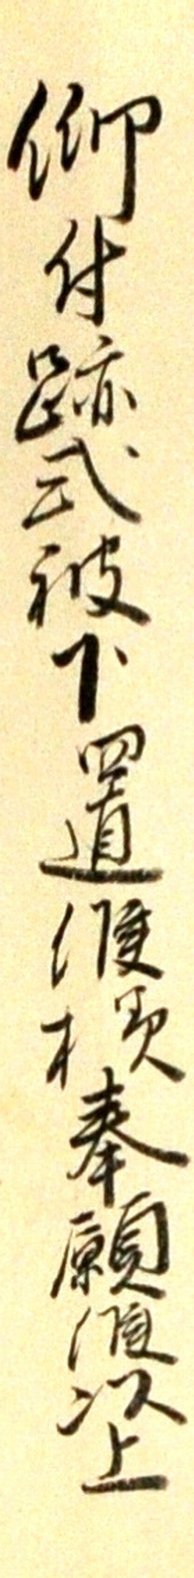仰付跡式被下置候様奉願候以上
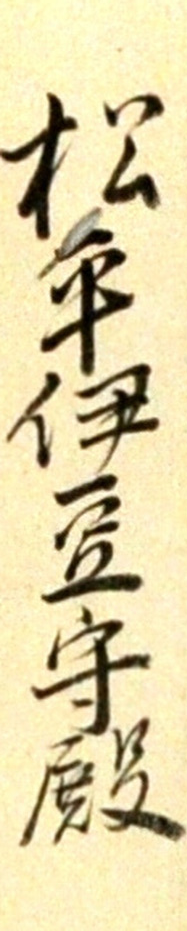松平伊豆守殿
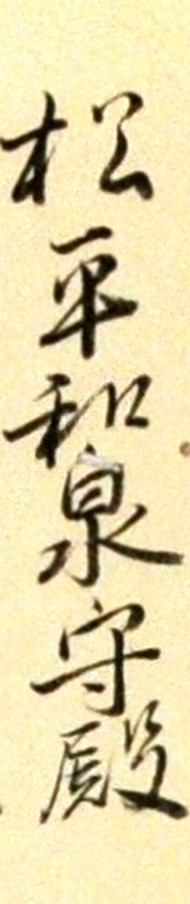松平和泉守殿
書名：仮養子願
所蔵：伊那市立高遠町図書館・合同会社AMANE
